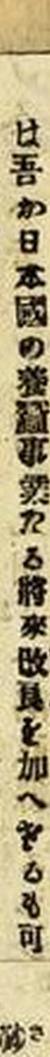は吾か日本国の養蚕事業たる将来改良を加へざるも可
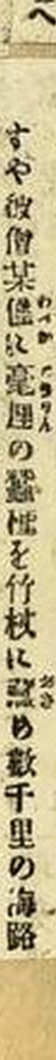すや彼僧某僅に毫厘の蚕種を竹杖に蔵め数千里の海路
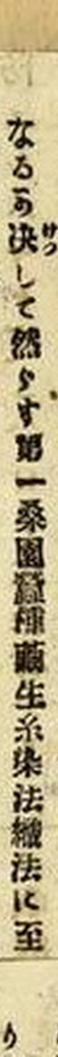なるか決して然らす第一桑園蚕種繭生糸染法織法に至
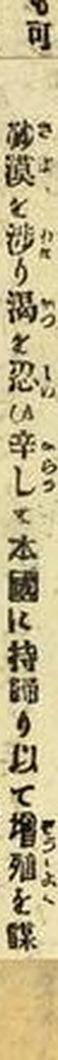砂漠を渉り渇を忍ひ辛して本国に持帰り以て増殖を謀
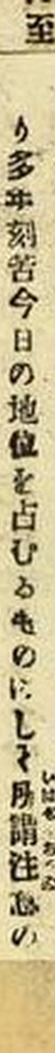り多年刻苦今日の地位を占むるものにして所謂注意の
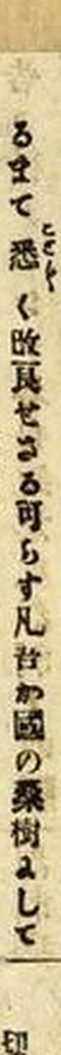るまて悉く改良せさる可らす凡吾か国の桑樹にして
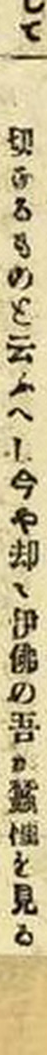切なるものと云ふへし今や却に伊仏の吾か蚕種を見る
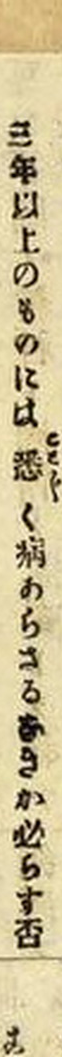三年以上のものには悉く病あらさるなきか必らす否
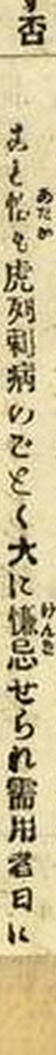こと恰も虎列刺病のごとく大に慊忌せられ需用者日に
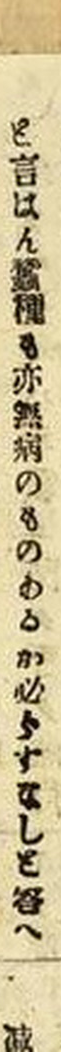と言はん蚕種も亦無病のものあるか必らすなしと答へ
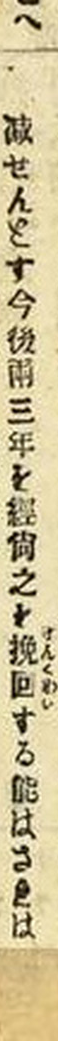減せんとす今後両三年を経尚之を挽回する能はされは
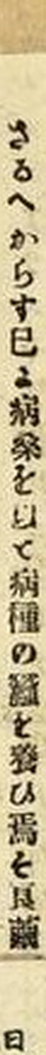さるへからす已に病桑を以て病種の蚕を養ひ焉そ良繭
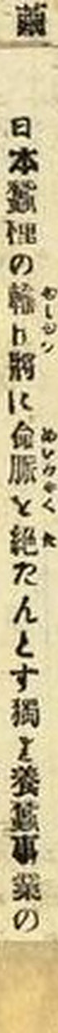日本蚕種の輸出将に命脈を絶たんとす独り養蚕事業の
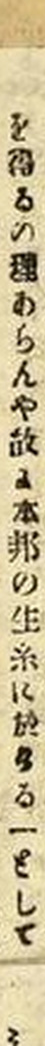を得るの理あらんや故に本邦の生糸に於ける一として
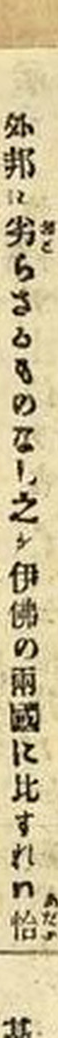外邦に劣らさるものなし之を伊仏の両国に比すれは恰
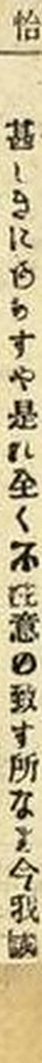甚しきにあらすや是れ全く不注意の致す所なり今我国
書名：温古集 五巻
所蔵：福井県文書館 Fukui Prefectural Archives
